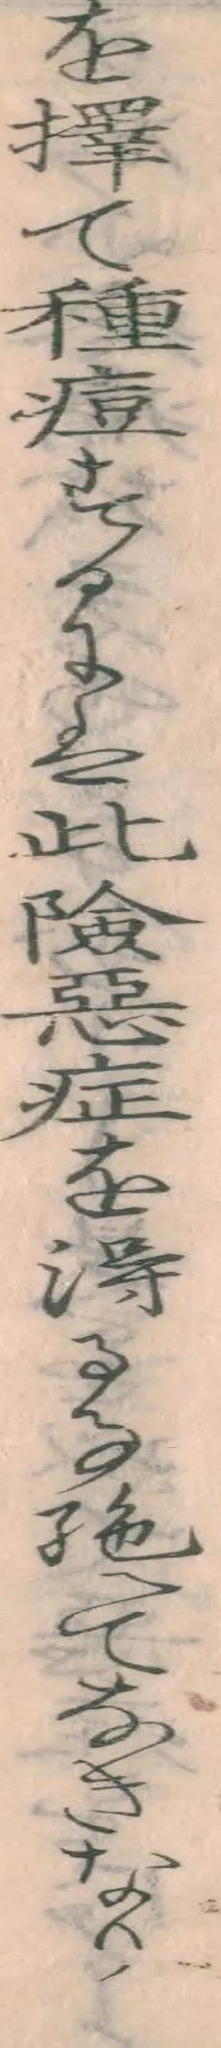を擇て種痘するには此険惡症を得る事絶へてなきなり
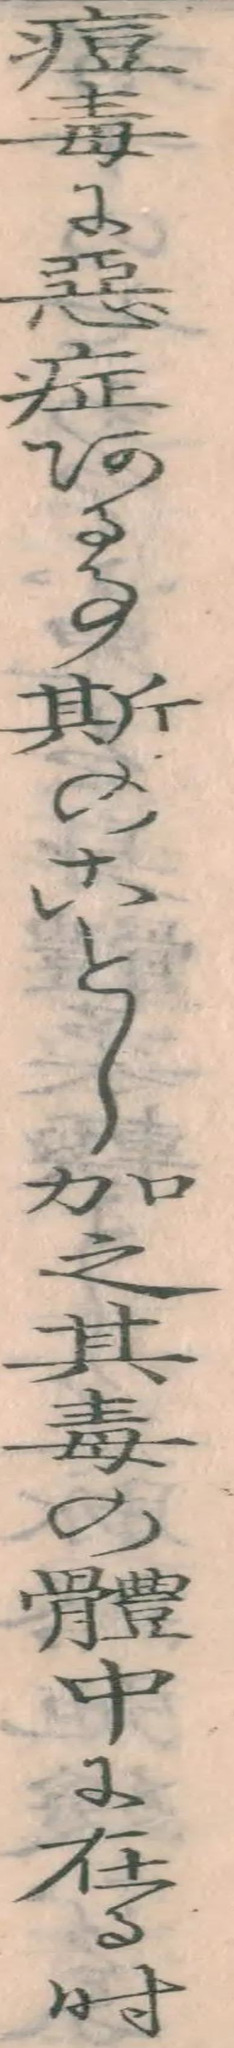痘毒に惡性ある事斯のことし加之其毒の體中に在る時
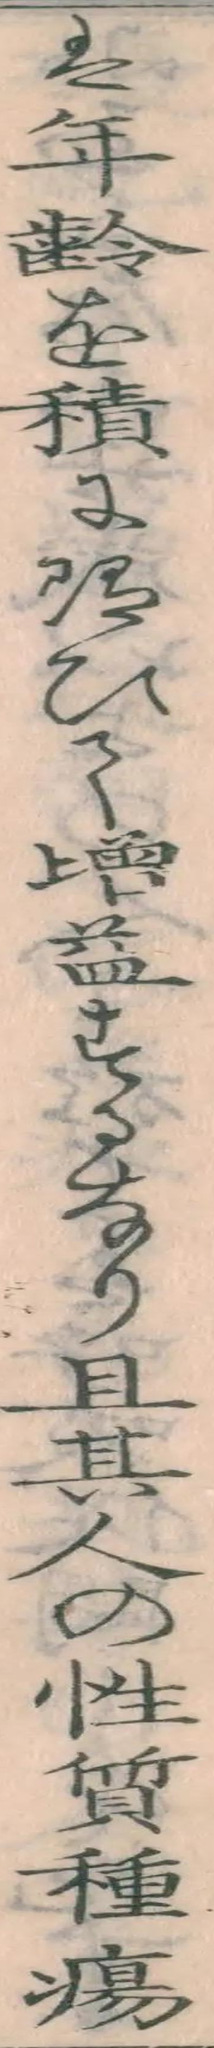は年齢を積に隨ひて増益するなり且其人の性質種瘍
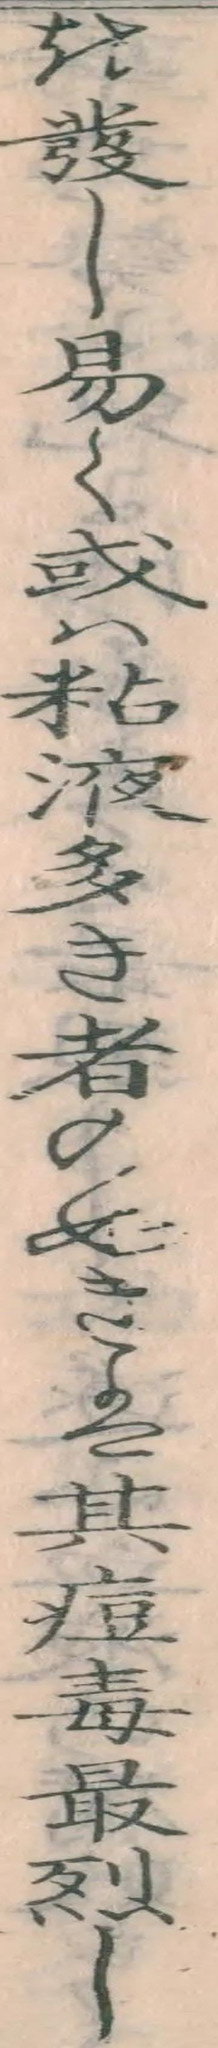を發し易く或は粘液多き者の如きは其痘毒最烈し
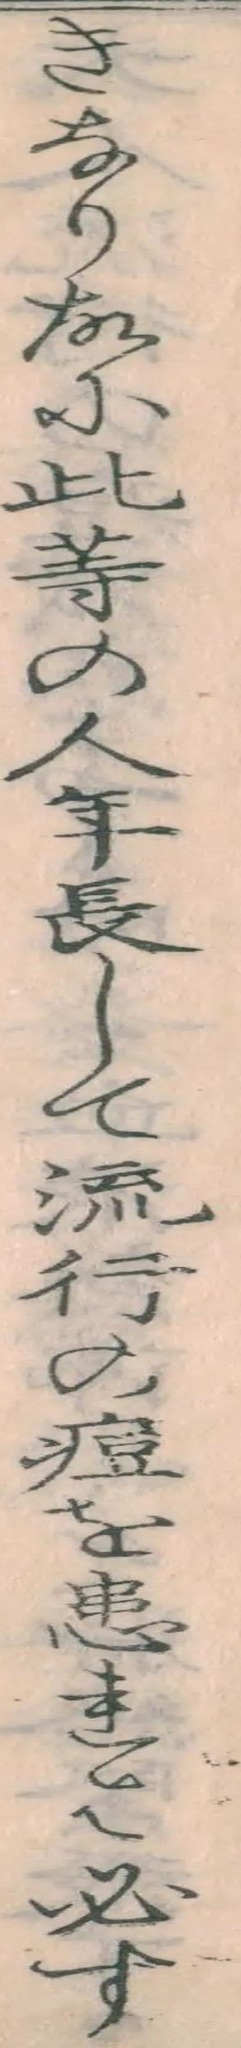きなり故に此等の人年長して流行の痘を患れは必す
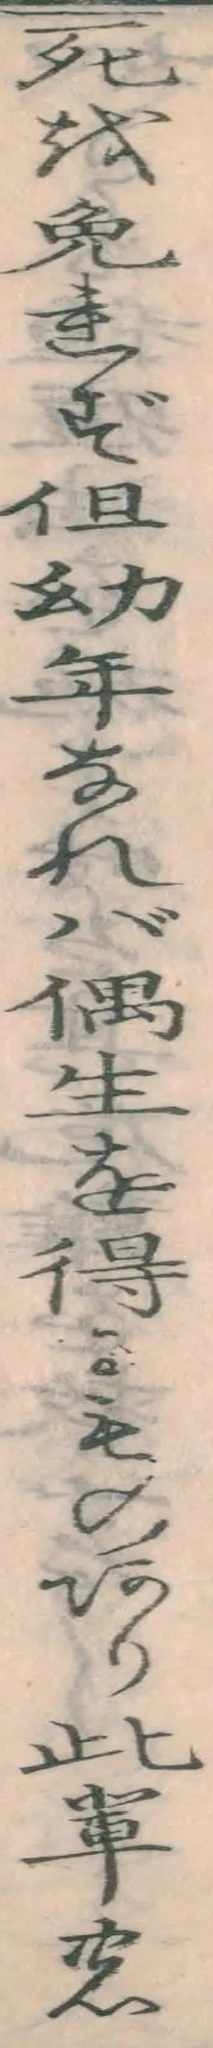死を免れず但幼年なれば偶生を得るものあり此草の

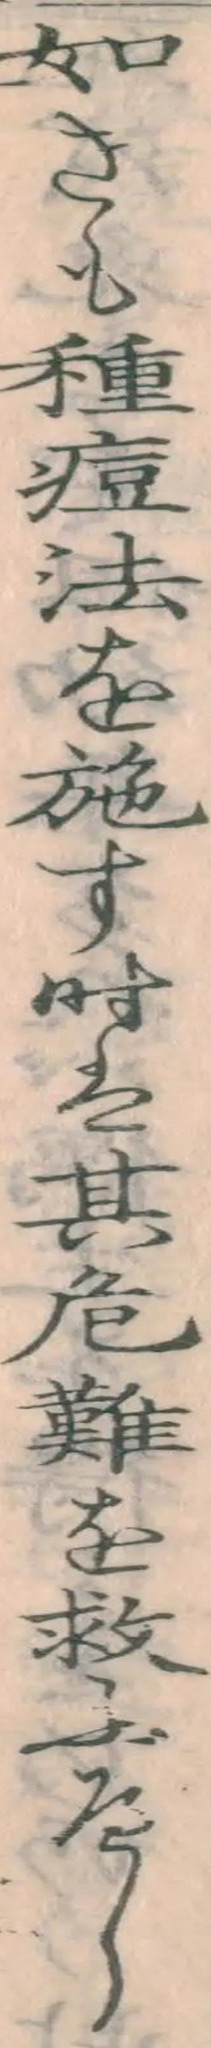如きも種痘法を施す時は其危難を救ふべし
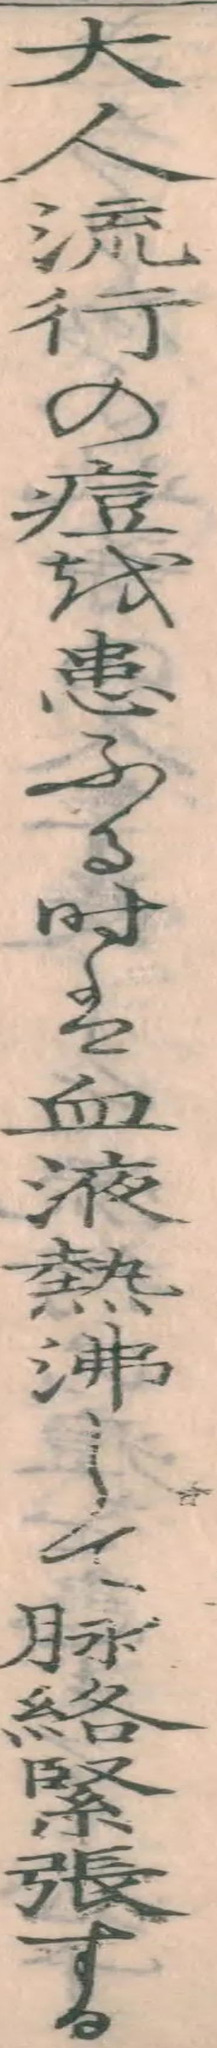大人流行の痘を患ふる時は血液熱沸して脉絡緊張する
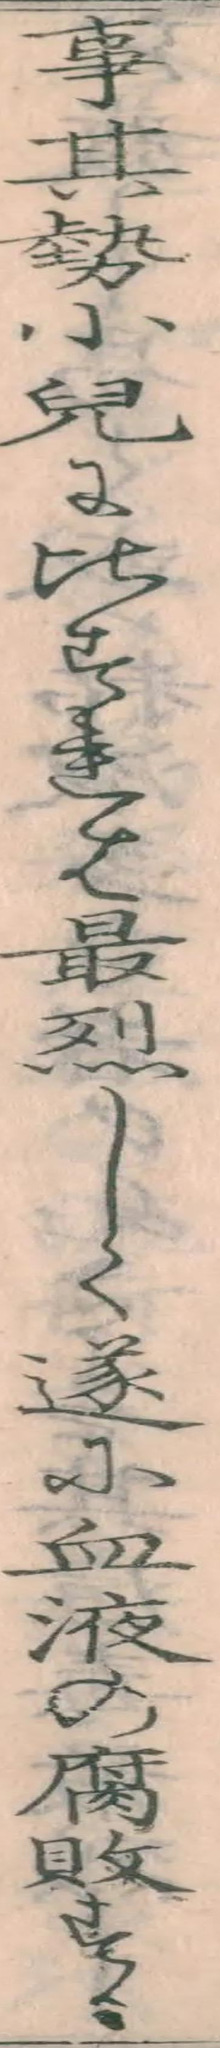事其勢小児に比すれは最烈しく遂に血液の腐敗する
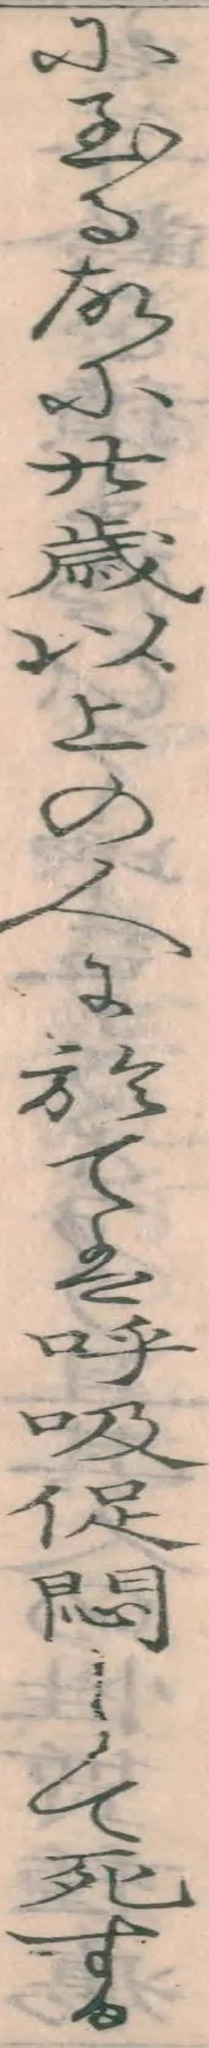に至る故に廿歳以上の人に於ては呼吸促悶して死する
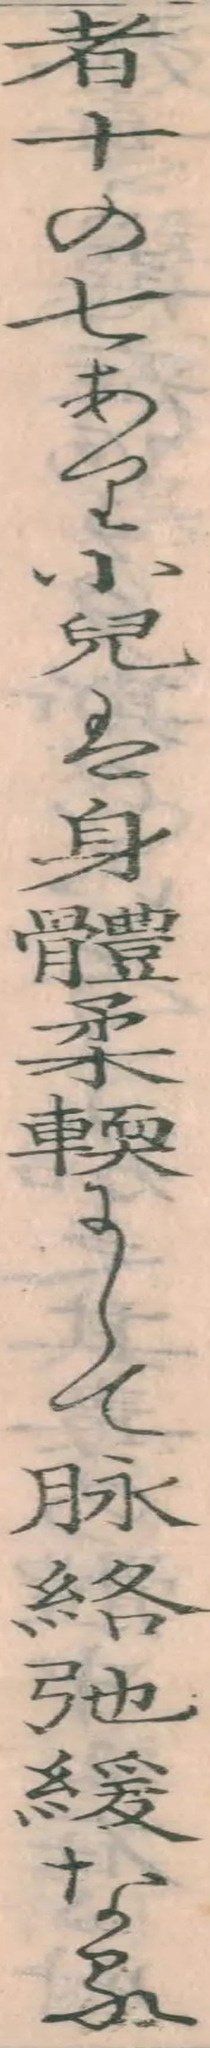者十の七あり小児は身體柔軟輭にして脉絡弛緩なる
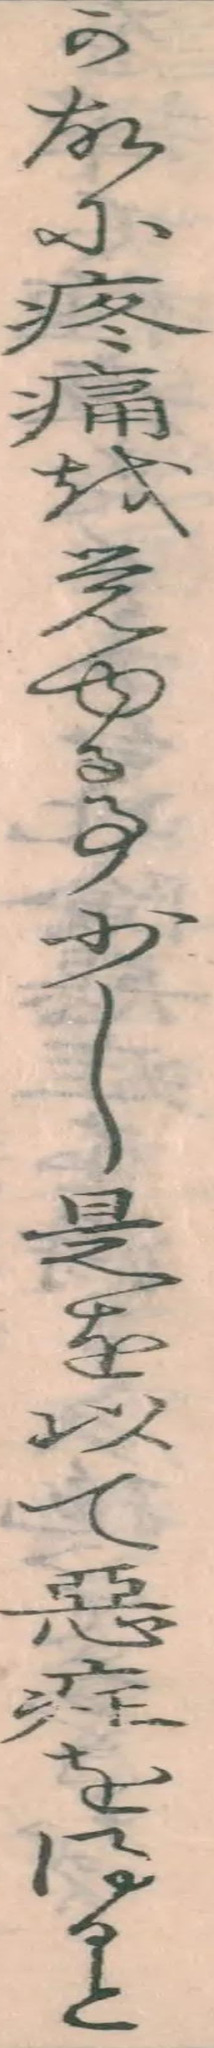の故に疼痛を覚ゆる事少し是を以て惡症を得ると
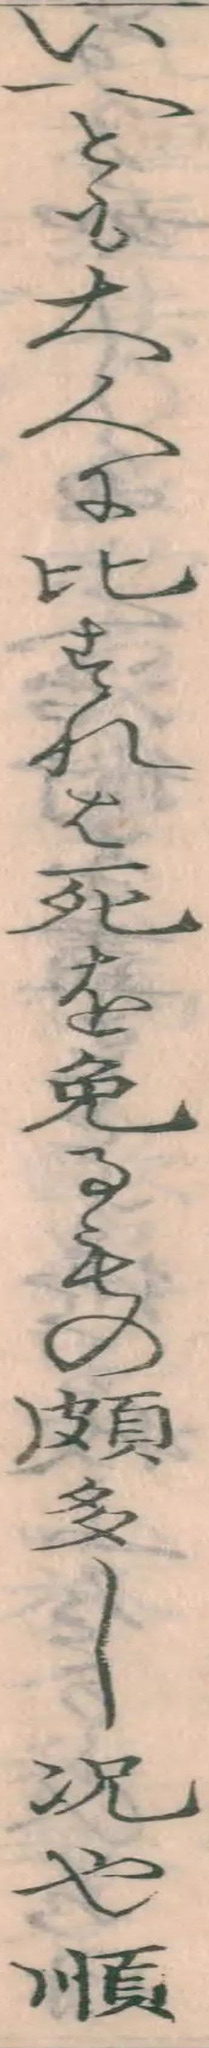いへとも大人に比すれは死を免るもの頗多し況や順
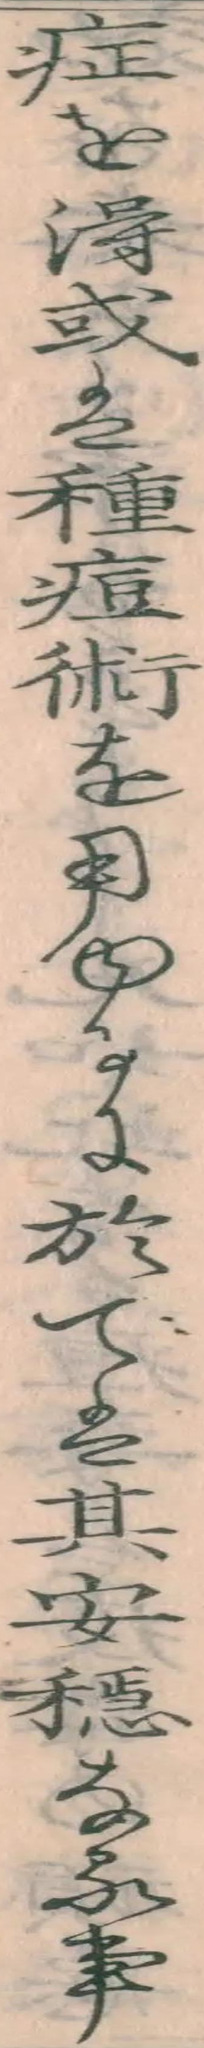痘を得或は種痘術を用ゆるに於ては其安穏なる事
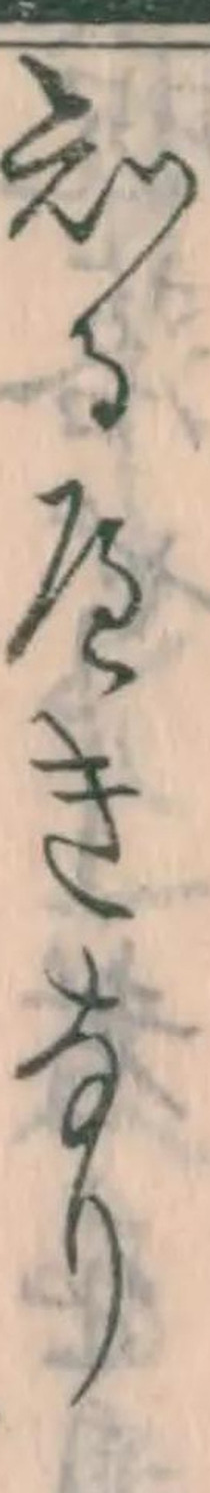知るべきなり
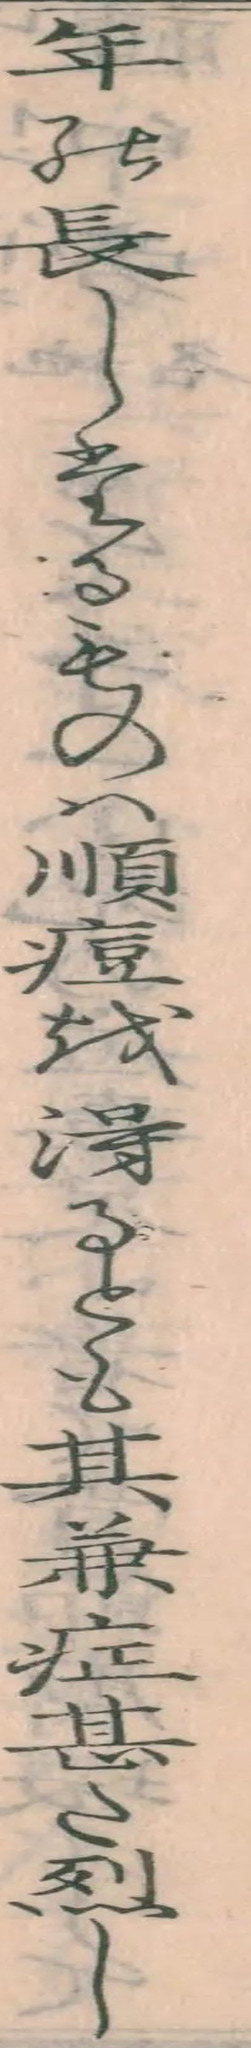年の長したるものは順痘を得るとも其兼症甚た烈し
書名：種痘新編
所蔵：国立国会図書館 National Diet Library, JAPAN
